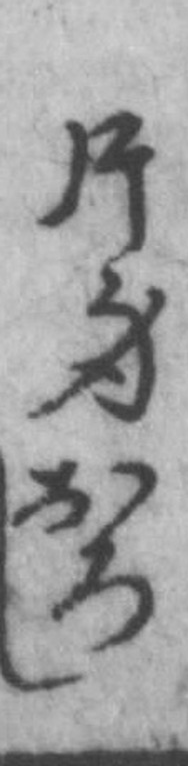片身おろし
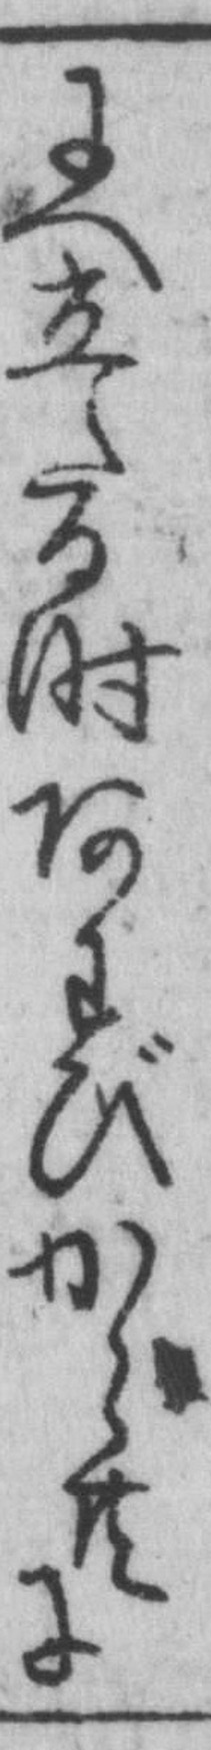にへ立てる時あわびから共に
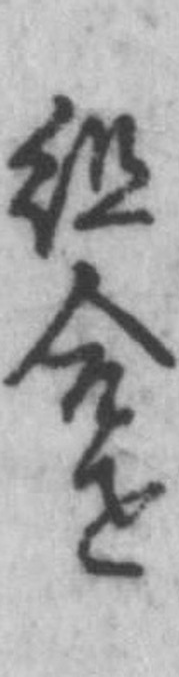組合を
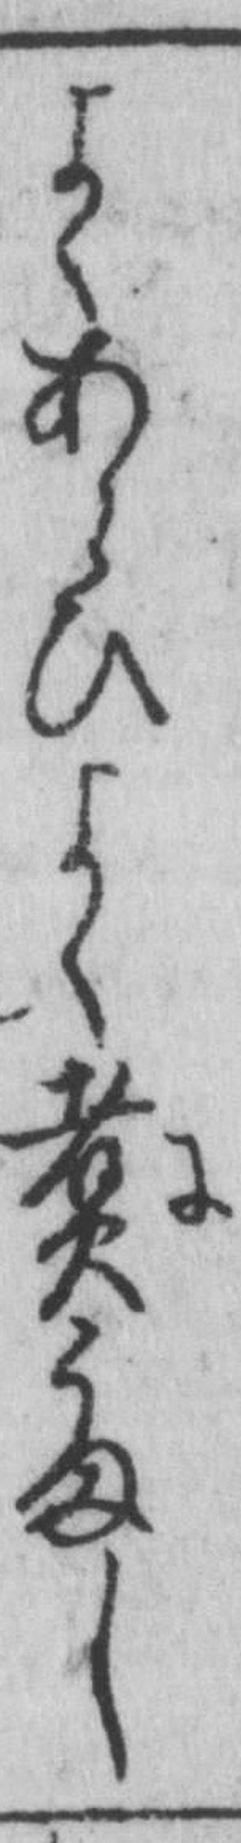よくあらひよく煮うまし
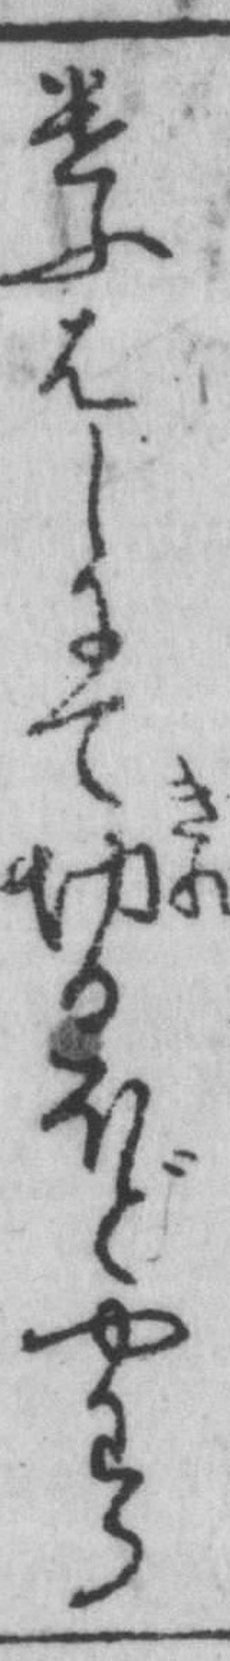遣ふはしにて切ほどやわら
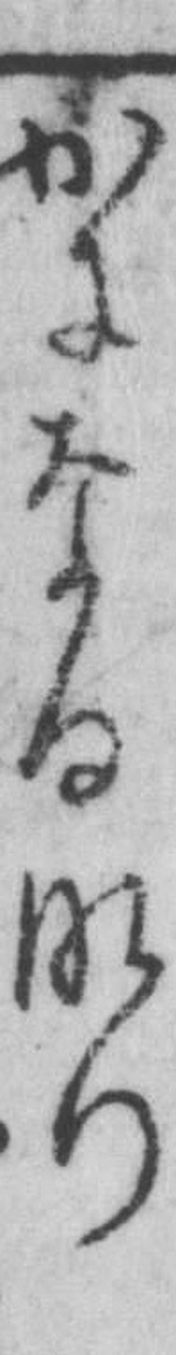かになるなり
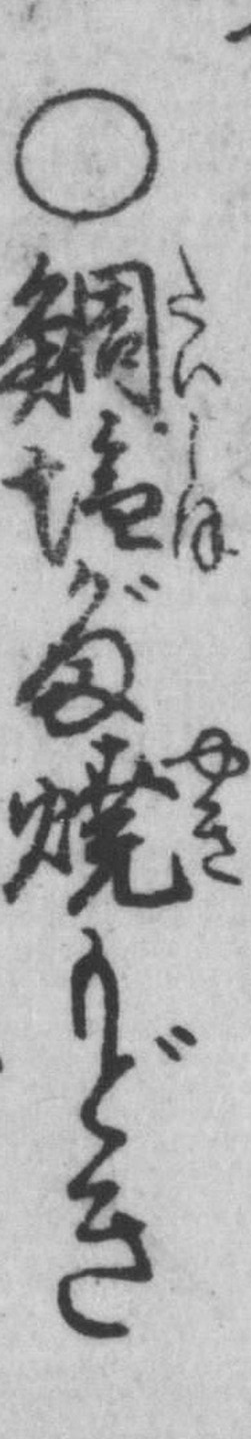〇鯛塩かば焼もどき
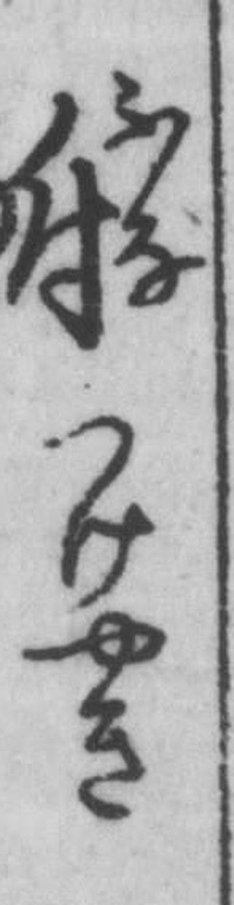魳鮒つけやき
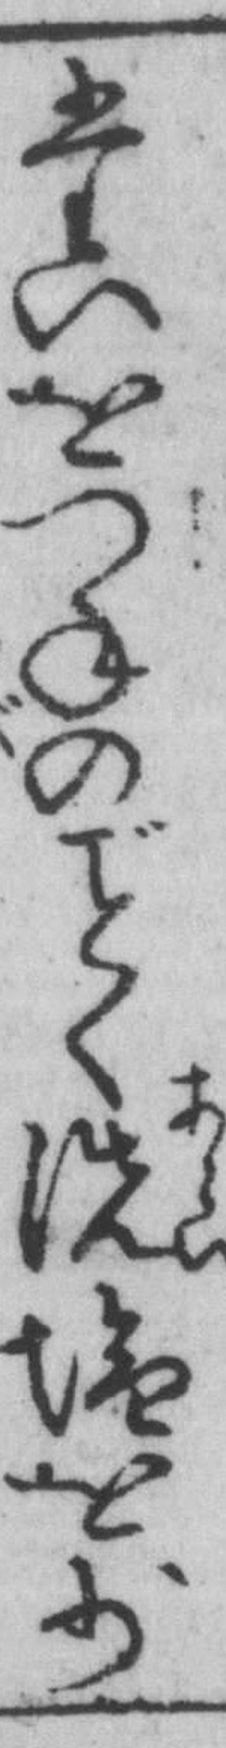鯛をつねのごとく洗塩を少
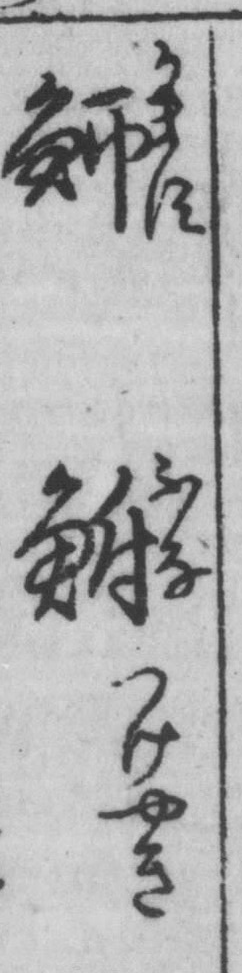魳鮒つけやき
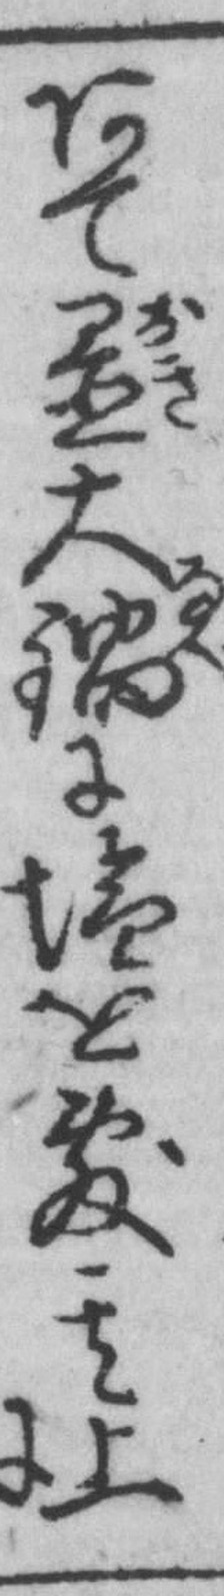あて置大鍋に塩を敷其上に
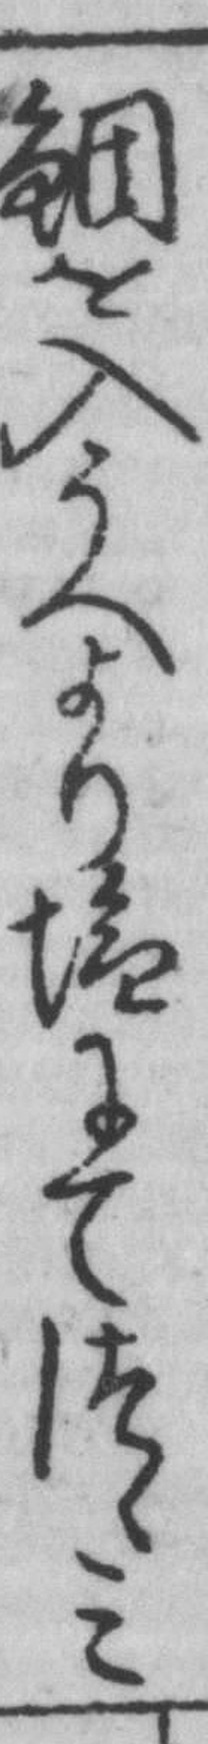隊をうへより塩にてつゝミ
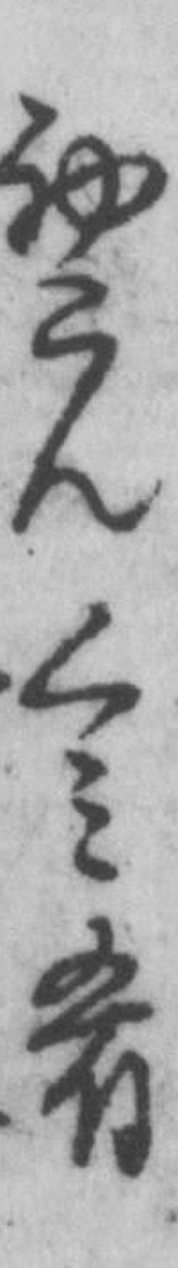初こんくミ肴
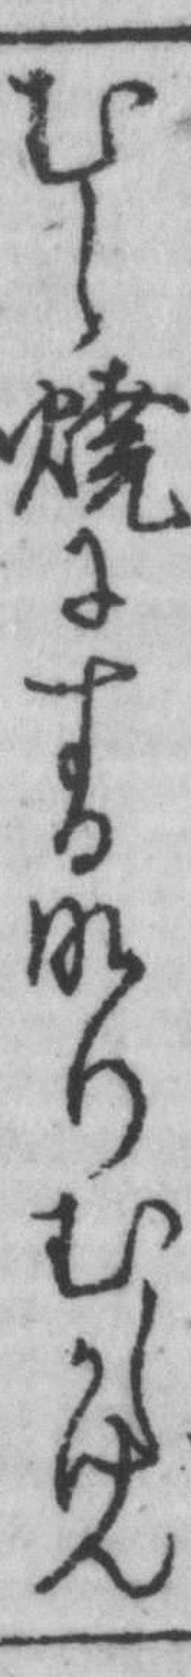むし焼にハするなりむしかげん
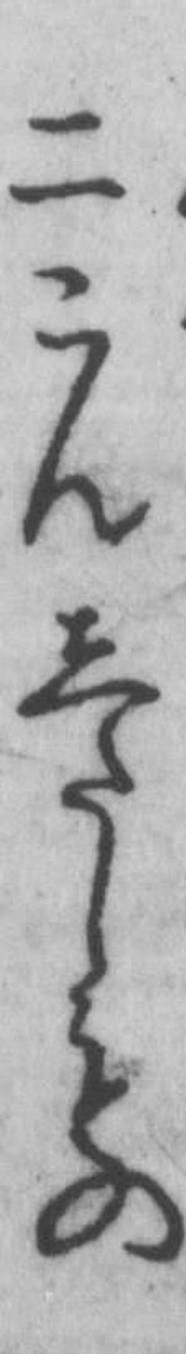二こんしたしもの
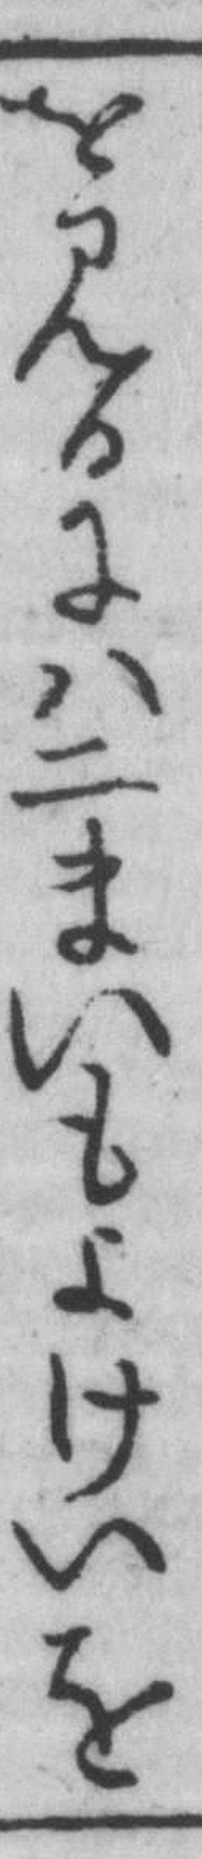を見るに二まいもよけいを
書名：料理献立抄
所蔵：大阪府立大学学術情報センター 国文学研究資料館
